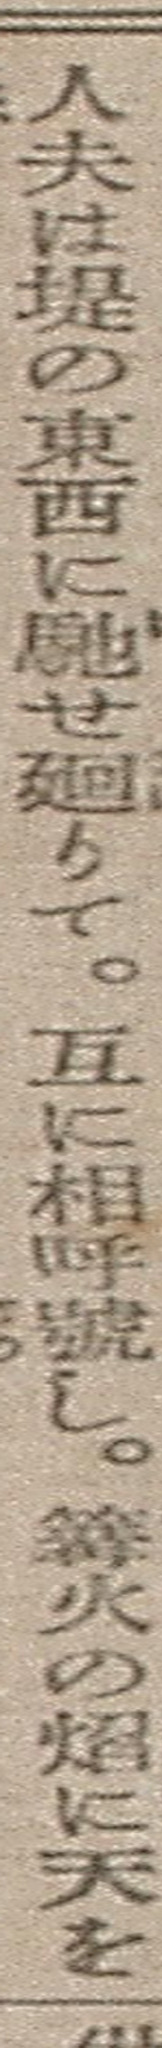人夫は堤の東西に馳せ廻りて。互に相呼号し。篝火の焔に天を
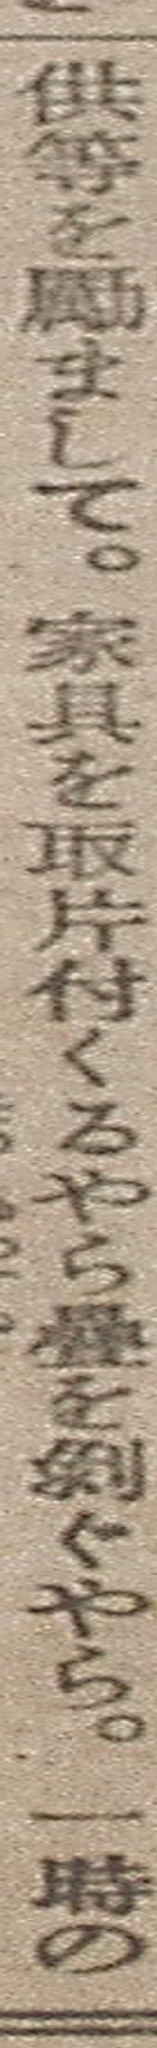供等を励まして。家具を取片付くるやら畳を剥ぐやら。一時の
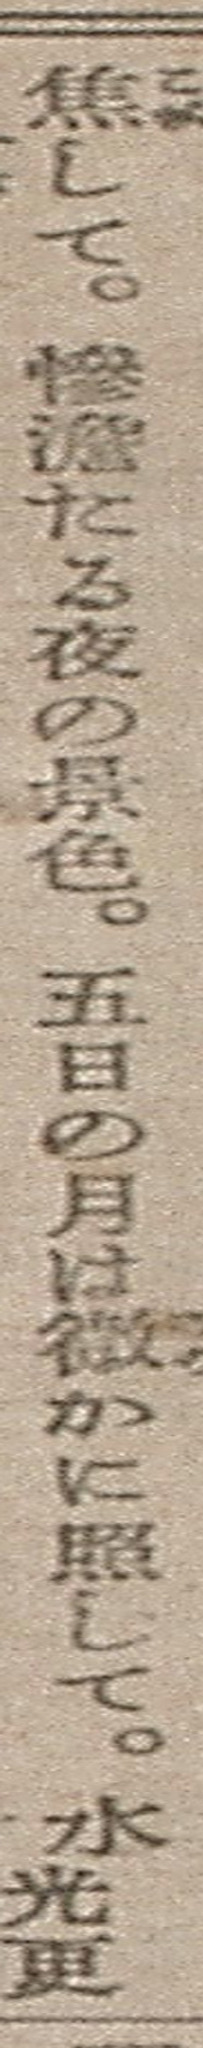焦して。惨憺たる夜の景色。五日の月は微かに照して。水光更
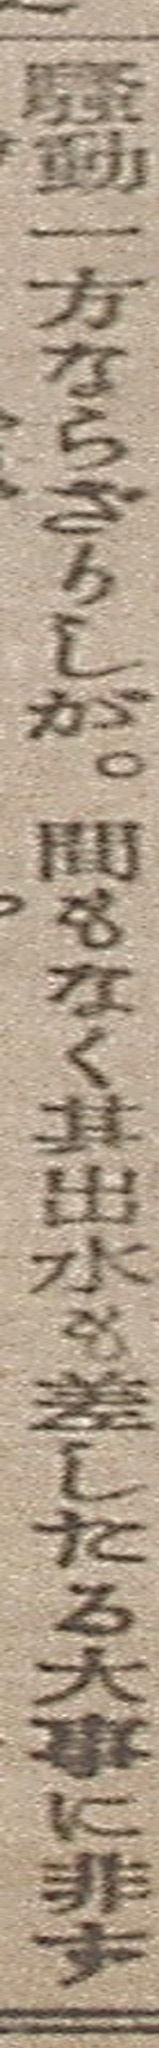騒動一方ならざりしが。間もなく其出水も差したる大事に非ず
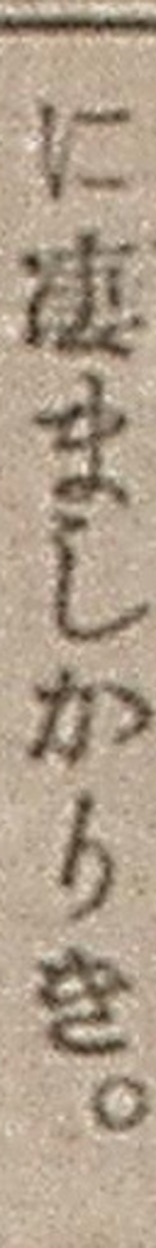に凄ましかりき。
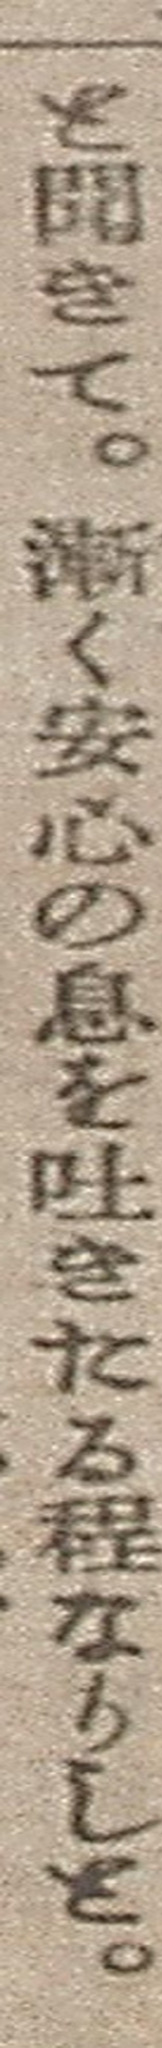と聞きて。漸く安心の息を吐きたる程なりしと。
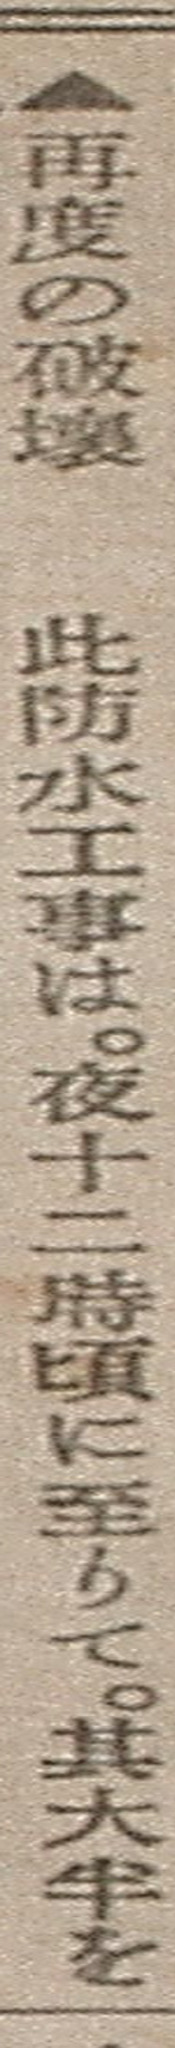▲再度の破壊此防水工事は。夜十二時頃に至りて。其大半を
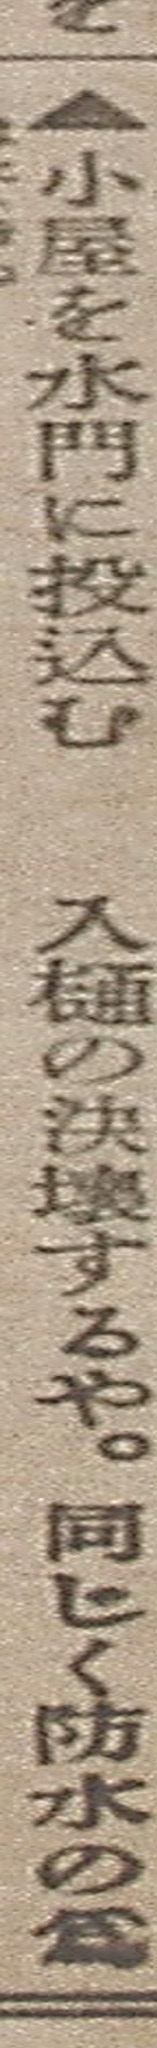▲小屋を水門に投込む入樋の決壊するや。同じく防水の為
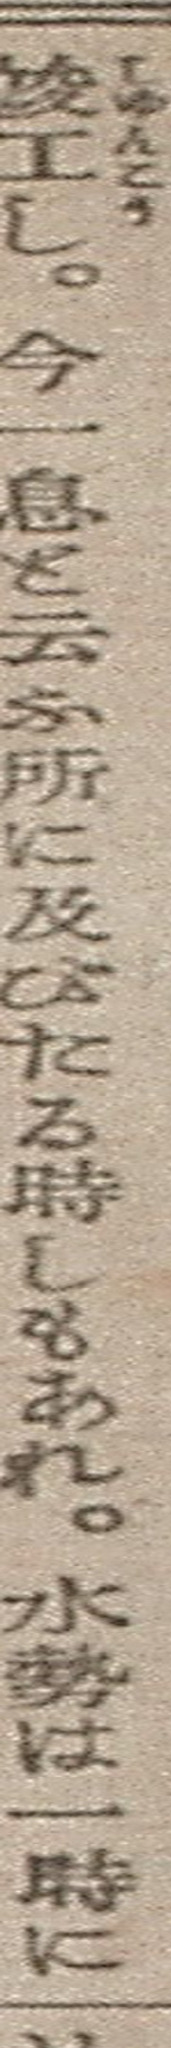竣工し。今一息と云ふ所に及びたる時しもあれ。水勢は一時に
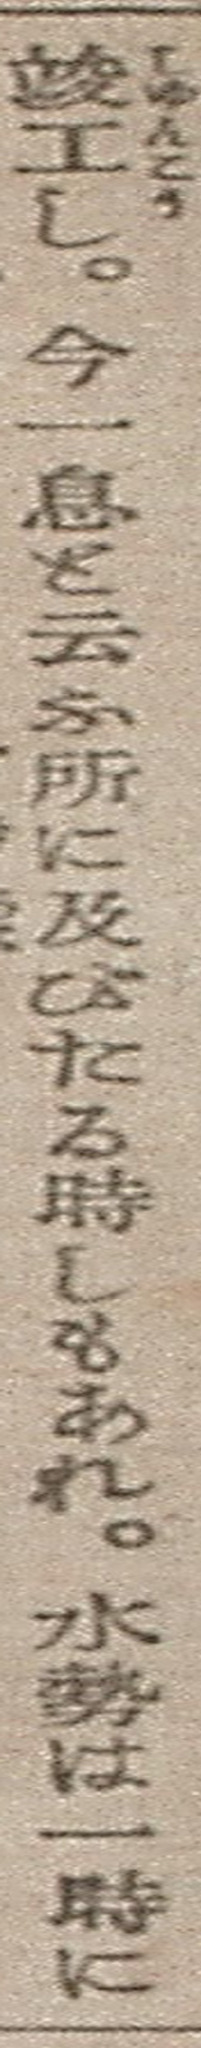竣工し。今一息と云ふ所に及びたる時しもあれ。水勢は一時に
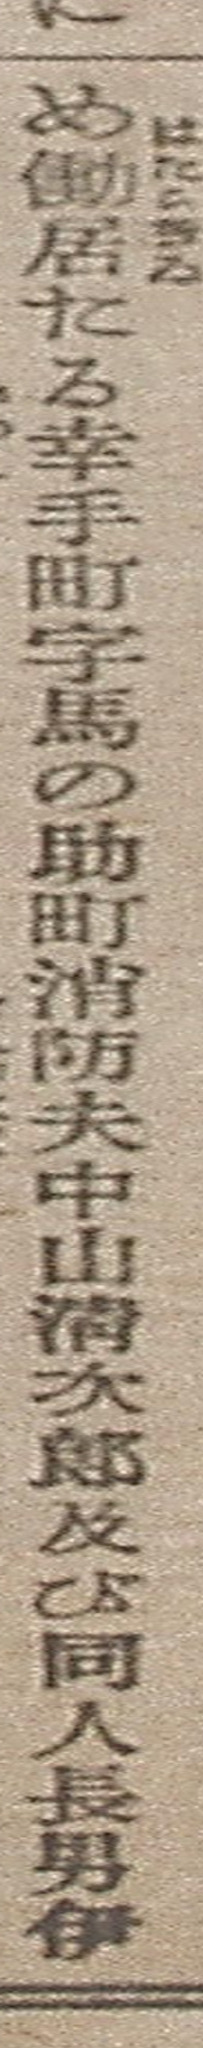め働居たる幸手町字馬の助町消防夫中山清次郎及び同人長男伊
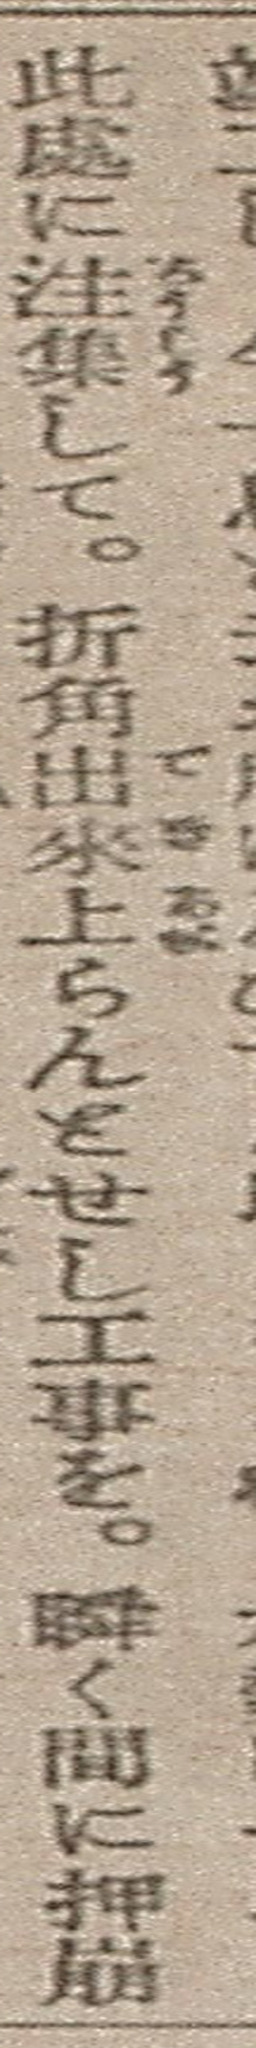此処に注集して。折角出来上らんとせし工事を。瞬く間に押崩
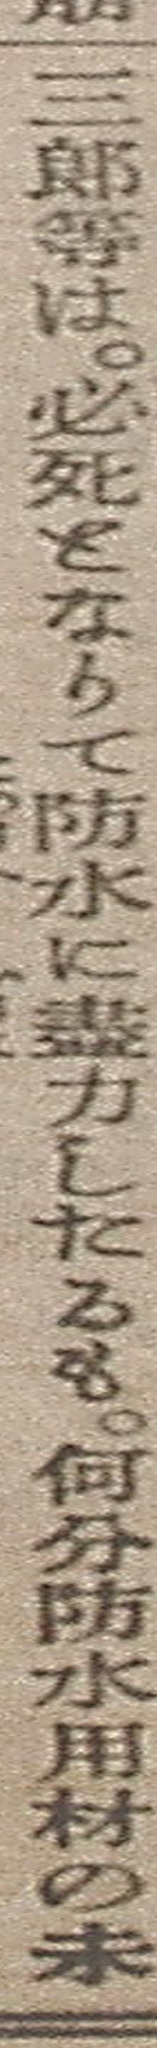三郎等は。必死となりて防水に尽力したるも。何分防水用材の未
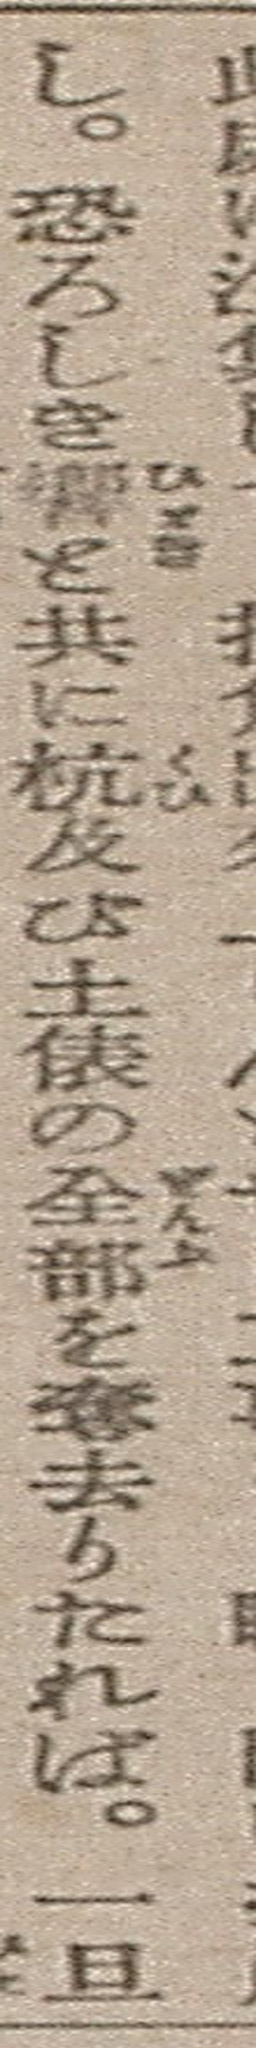し。恐ろしき響と共に杭及び土俵の全部を奪去りたれば。一旦
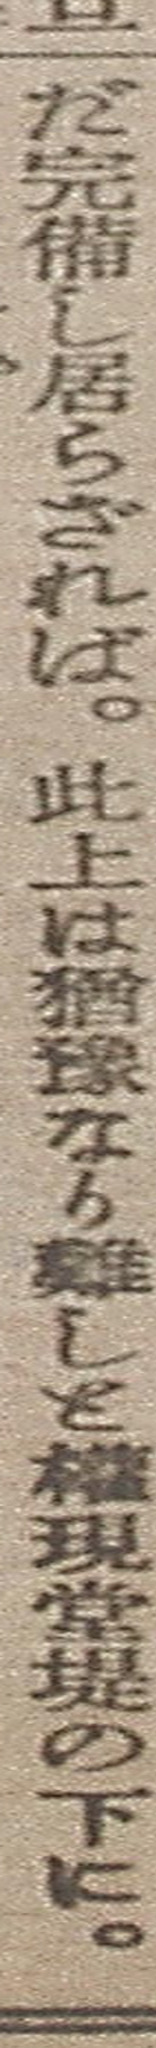だ完備し居らざれば。此上は猶予なり難しと権現堂堤の下に。
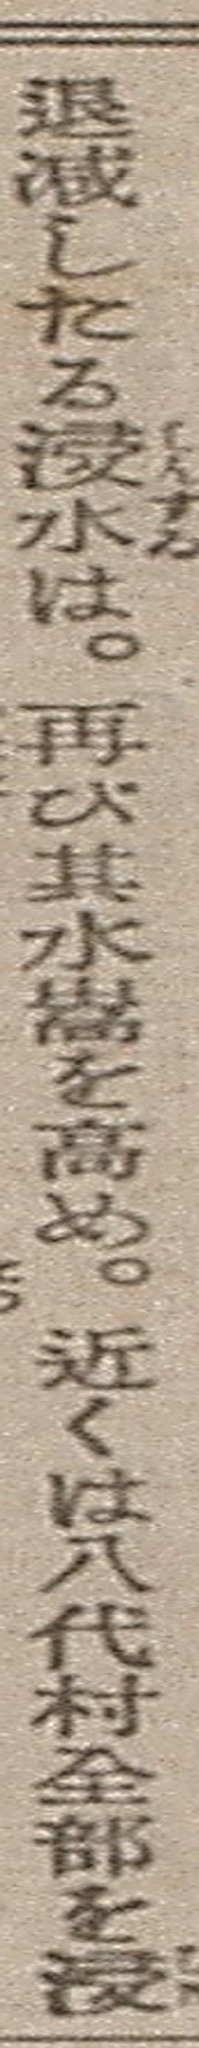退減したる浸水は。再び其水嵩を高め。近くは八代村全部を浸
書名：風俗畫報臨時増刊第百九十九號　明治三十二年十月各地災害圖會（前編之續）
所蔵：東京大学地震研究所図書室 Earthquake Research Institute Library, The University of Tokyo, JAPAN
